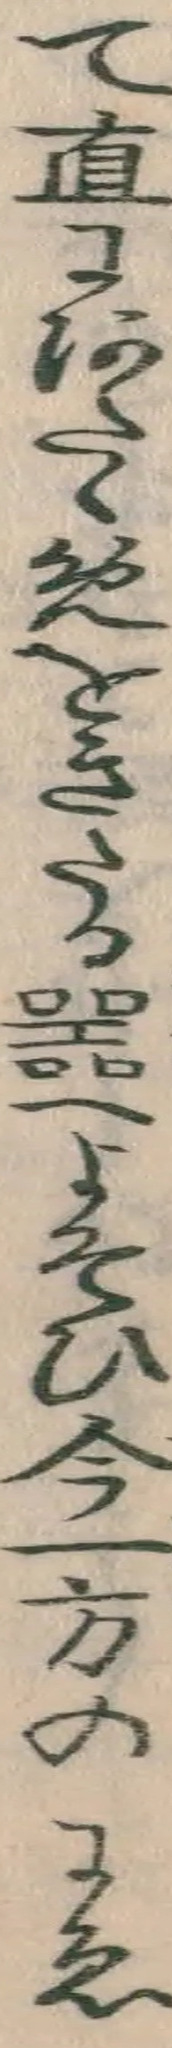て直にあた々ゝめをきたる器へよそひ今一方のにゑ
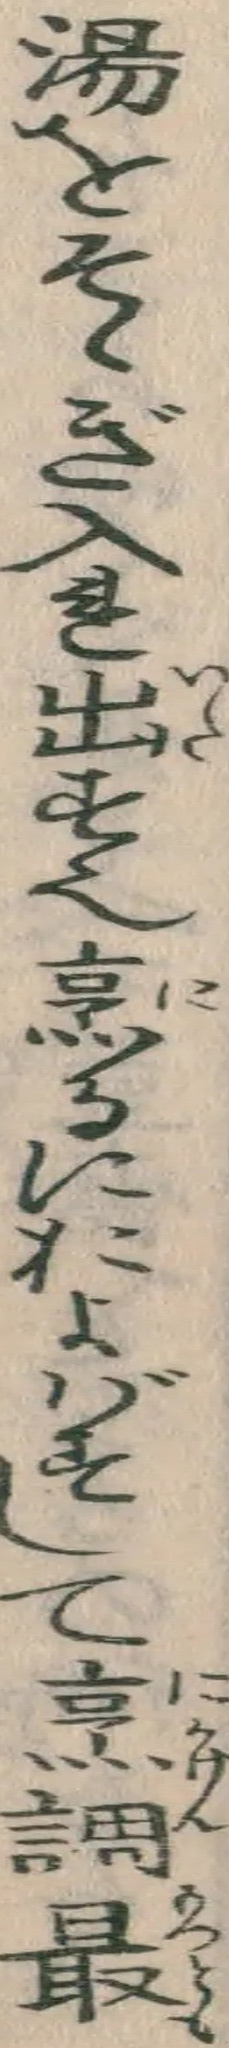湯をそゝぎ入れ出す也煮るにおよバれして煮調最
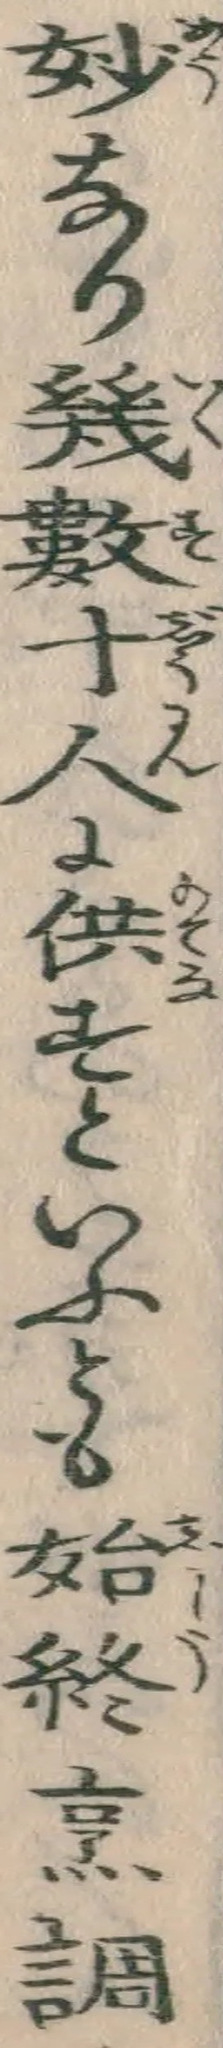妙なり幾数十人に供すといふとも始終煮調
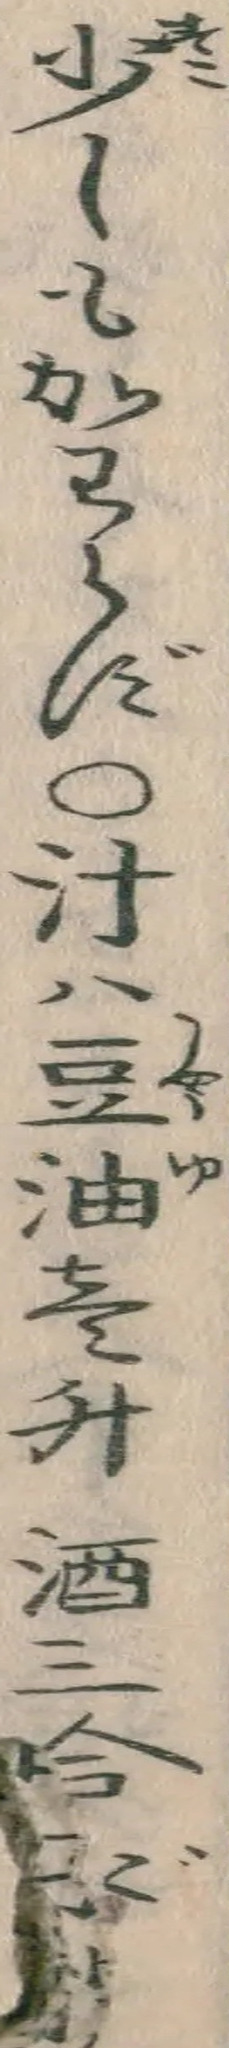少しもかわらず〇汁ハ豆油壱升酒三合
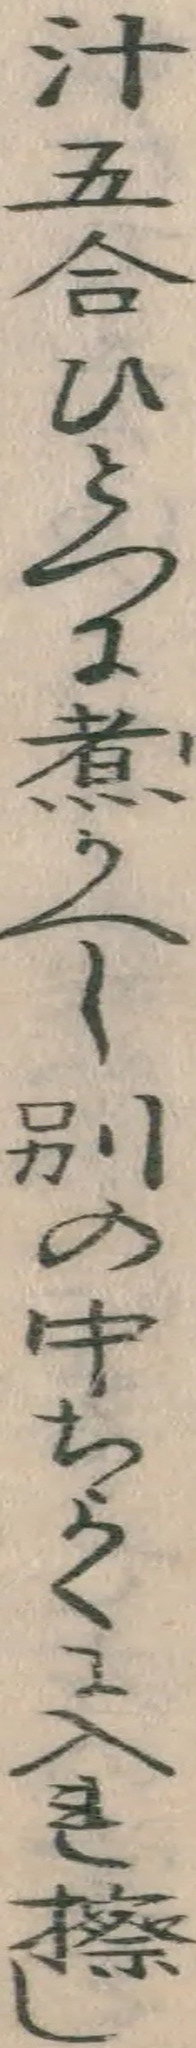汁五合ひとつに煮かへし別の中ちよくに入れ擦し
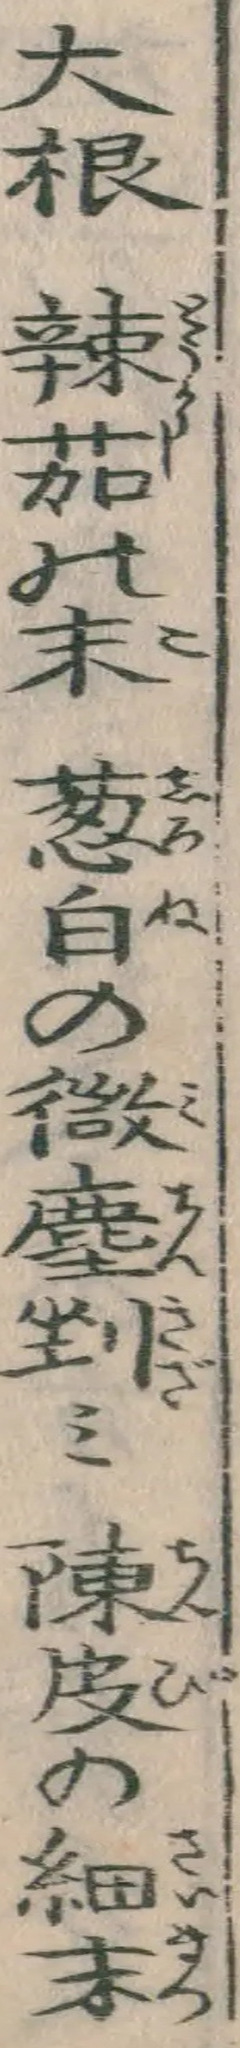大根辣茄の末葱白の微塵刻ミ陳皮の細末
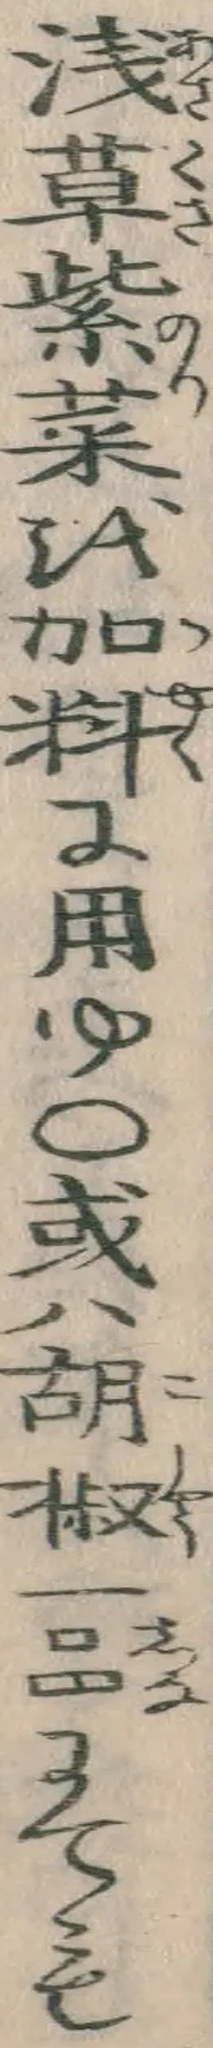浅草紫菜を加料に用ゆ〇或るハ胡椒一品にても
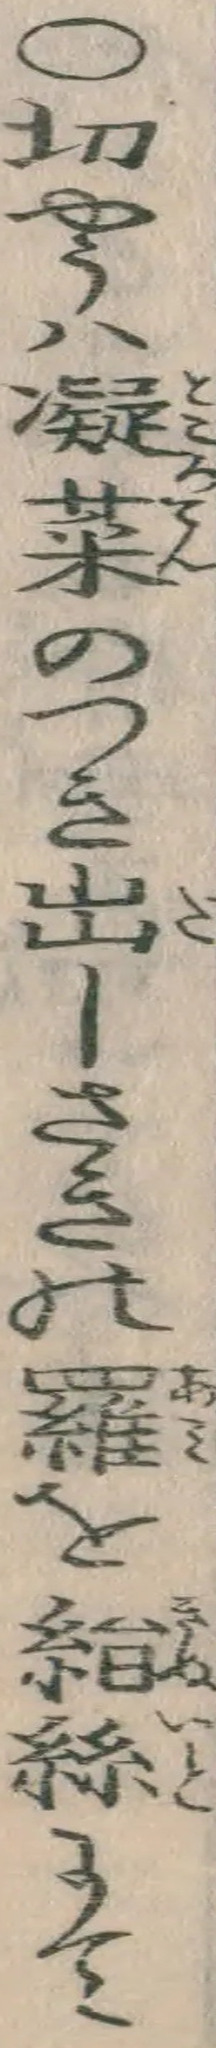〇切ゆうハ凝菜のつき出しさきの羅を絹絲にて
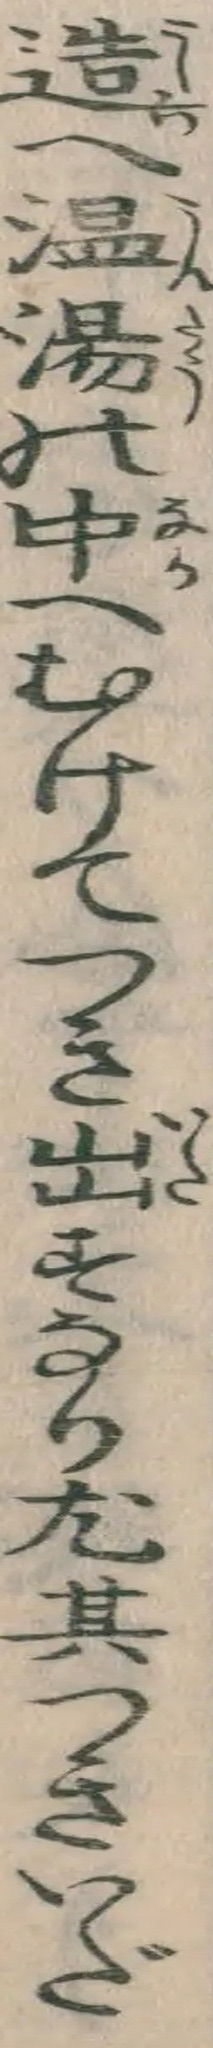造へ温湯の中へむけてつき出すなり尤其つきいだ

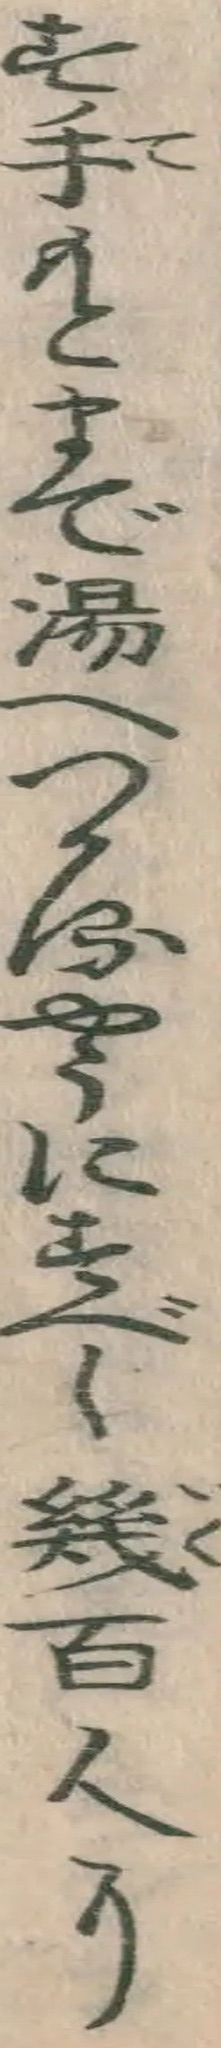す手もとまで湯へつかるやうにすべし幾百人に
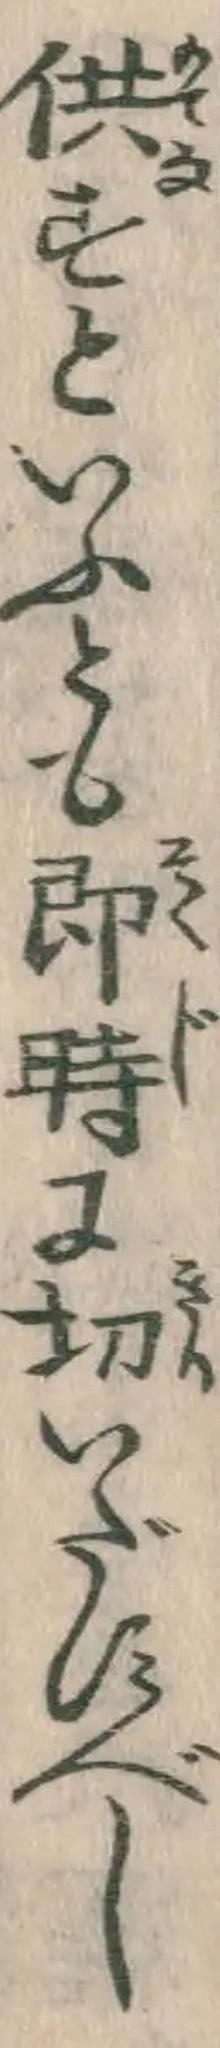供すといふとも即時に切いだすべし
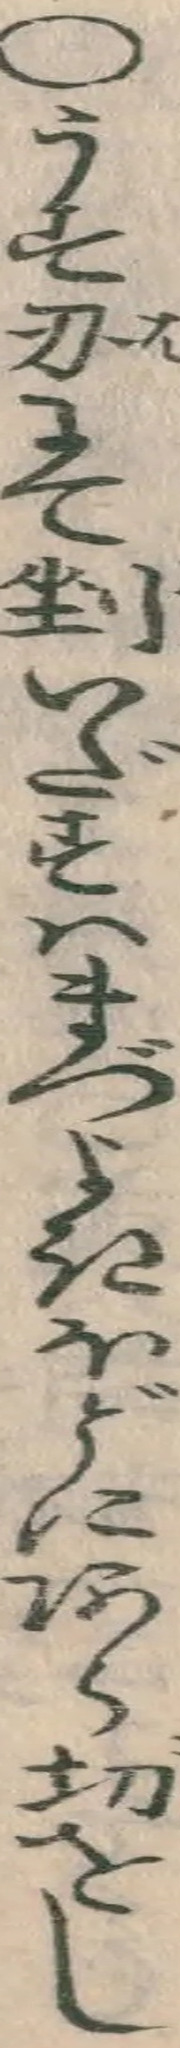○うす刃にて剉いだすはまづよきほどにあら切をし
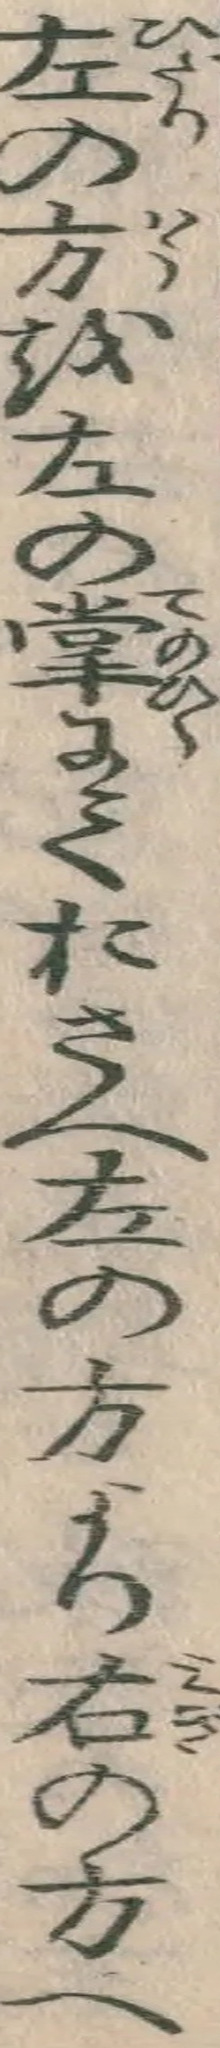左の方を左の掌にておさへ左の方より右の方へ
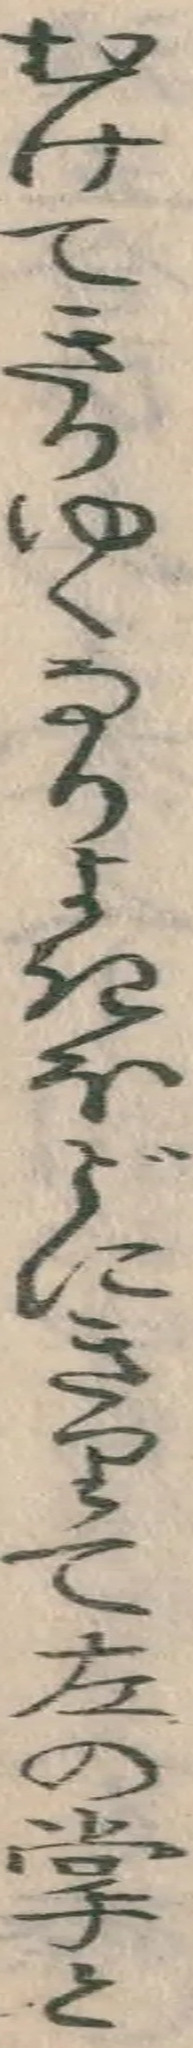むけてきりゆくなりよきほどにきりて左の掌と
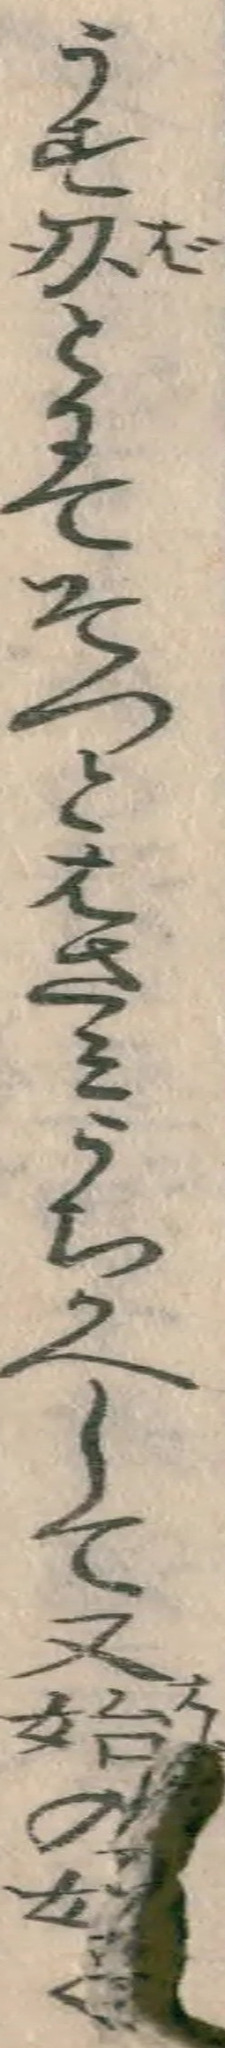うす刃とにてそつとはさみうちかへして又始の如く
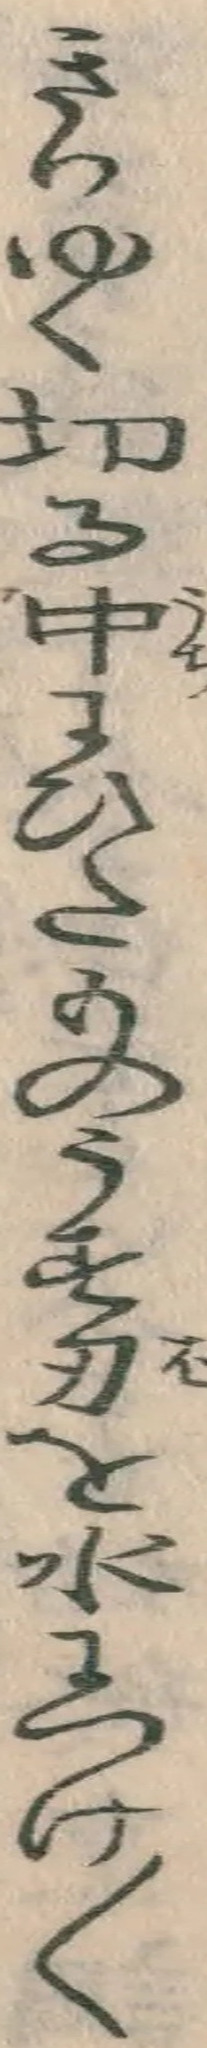きりゆく切る中にひたものうす刃を水につけ〳〵
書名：豆腐百珍. [正編]
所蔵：国立国会図書館 National Diet Library, JAPAN
